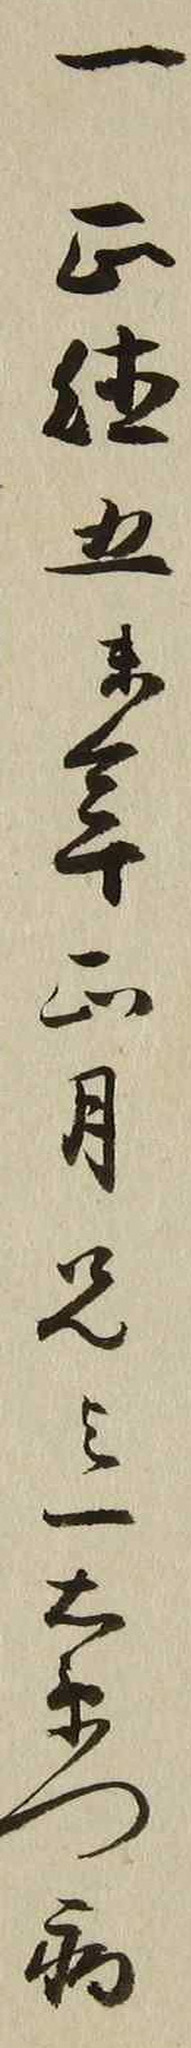一正徳五未年正月兄与一右衛門病
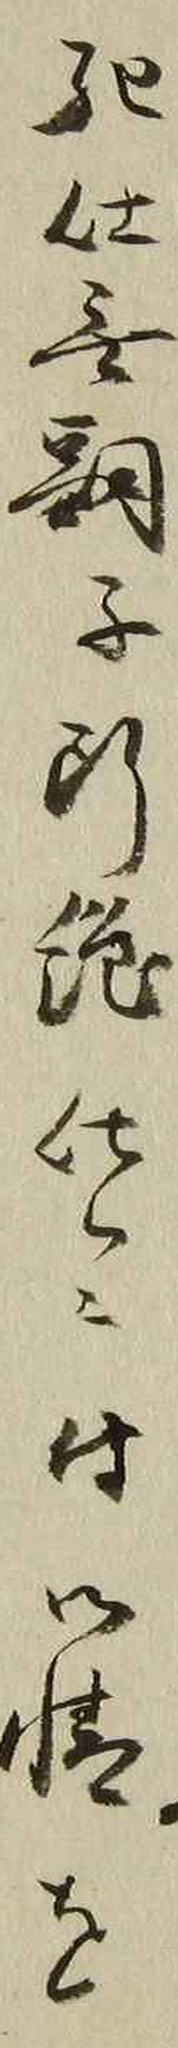死仕無嗣子断絶仕候ニ付御情を
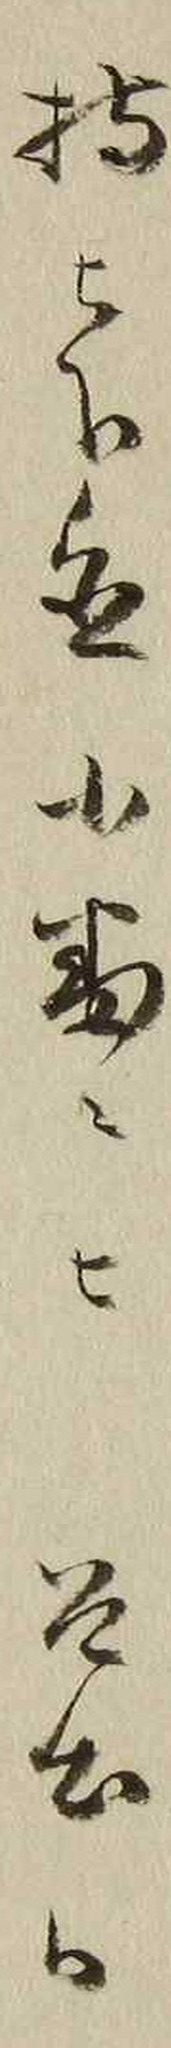持被下置小番ニ被召出候
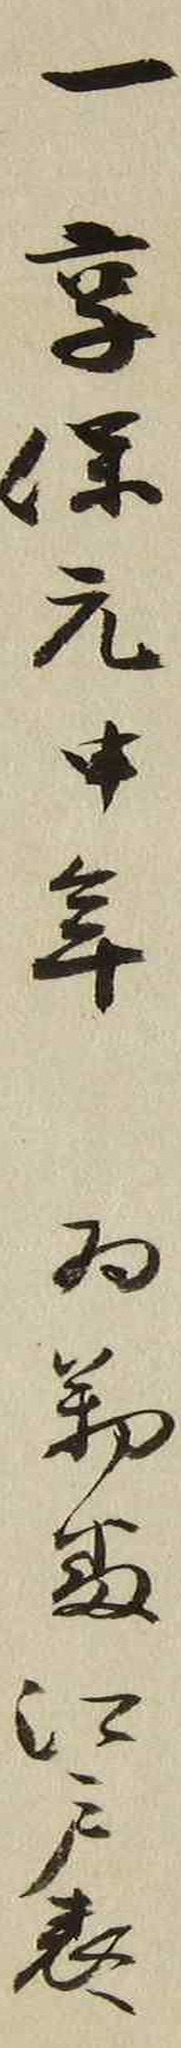一享保元申年為勤番江戸表へ
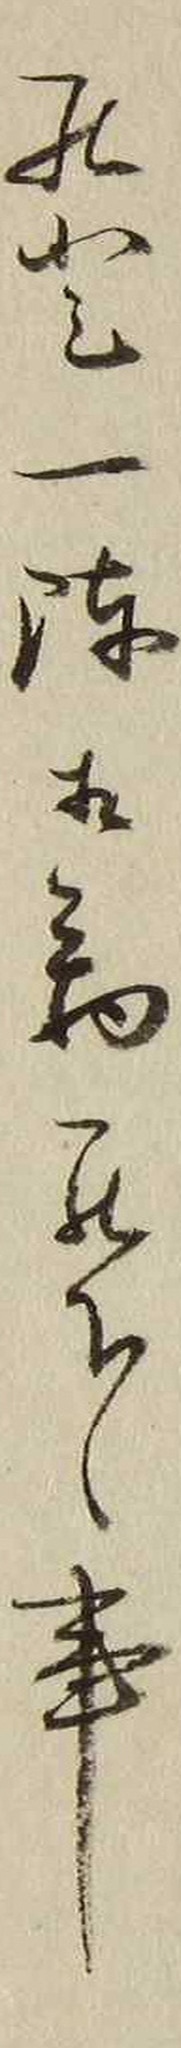罷登一陣相勤罷下候事
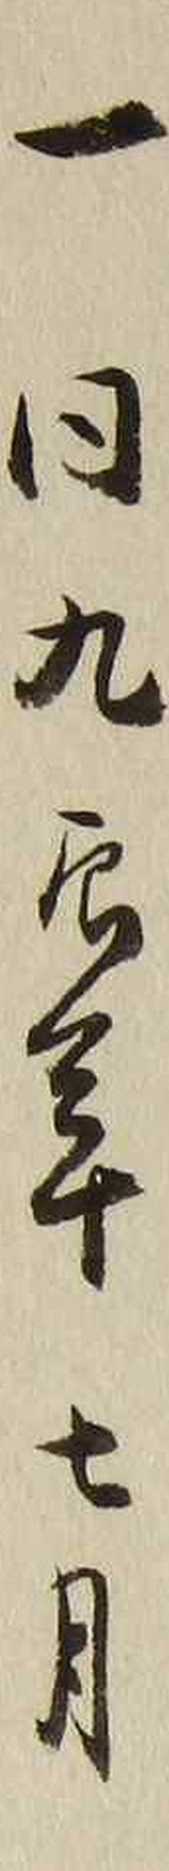一同九辰年七月
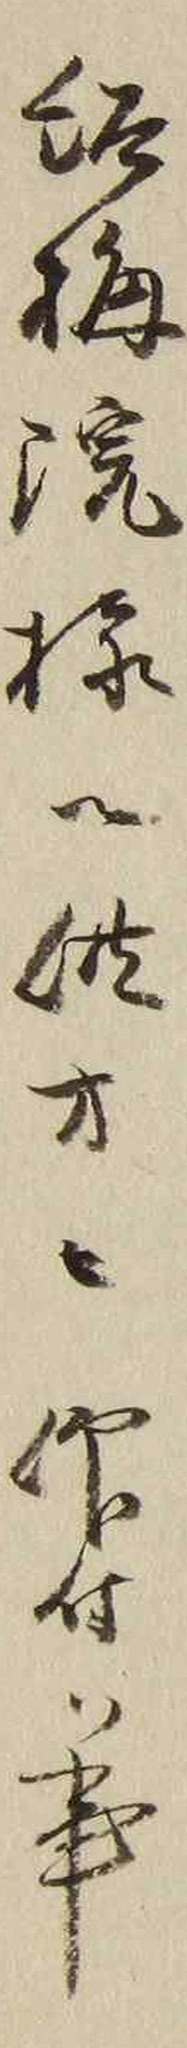紹栴院様御供方被仰付候事
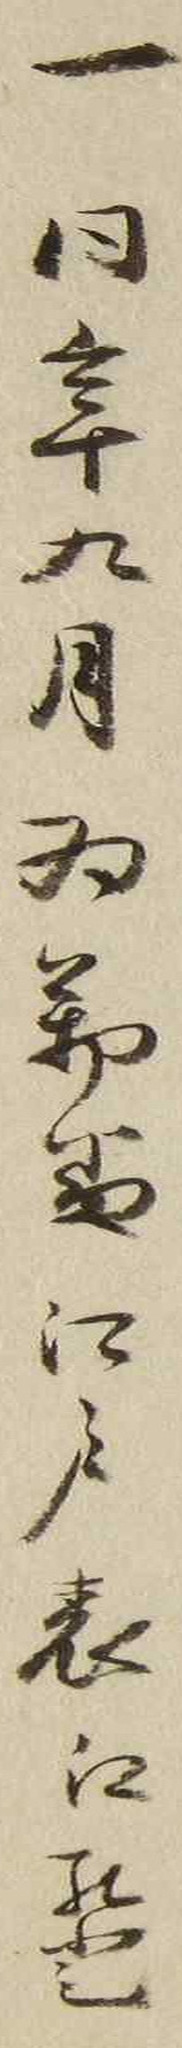一同年九月為勤番江戸表江罷登

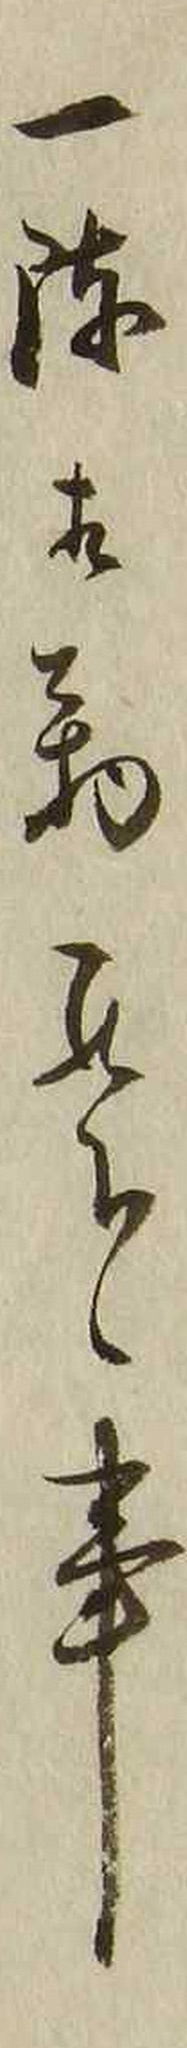一陣相勤罷下候事
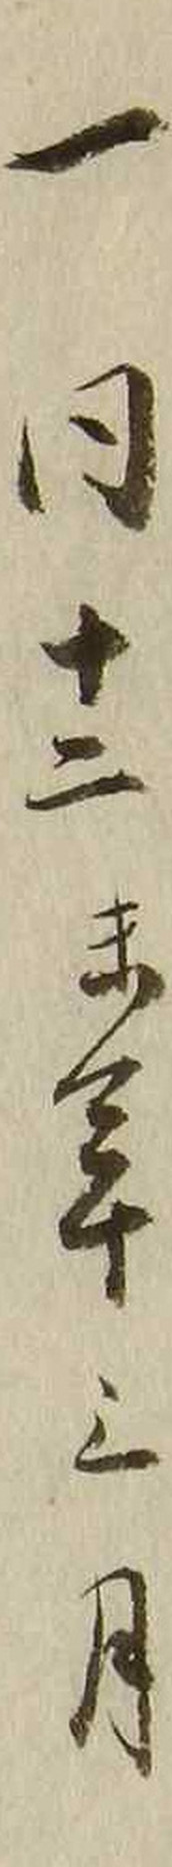一同十二未年三月
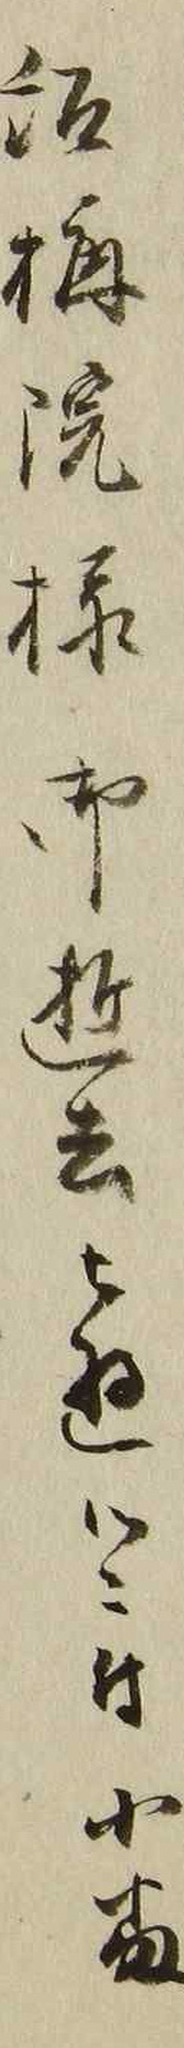紹栴院様御逝去被遊候ニ付小番
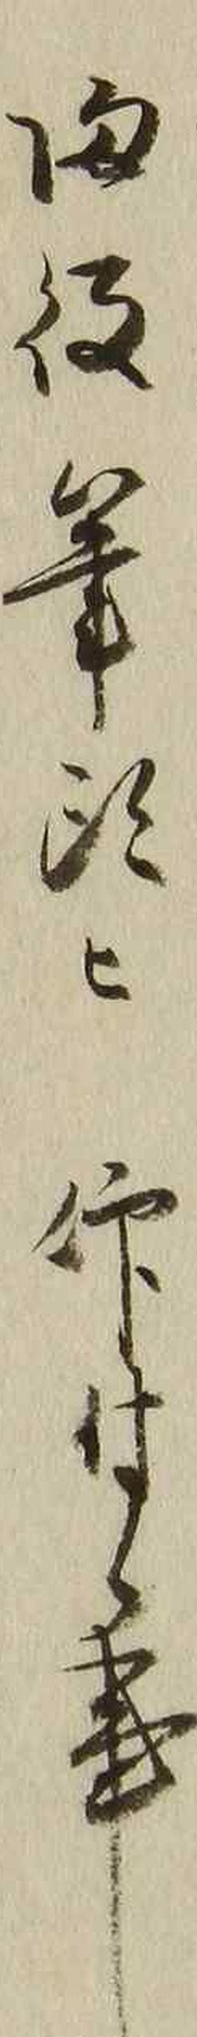帰役筆頭被仰付候事
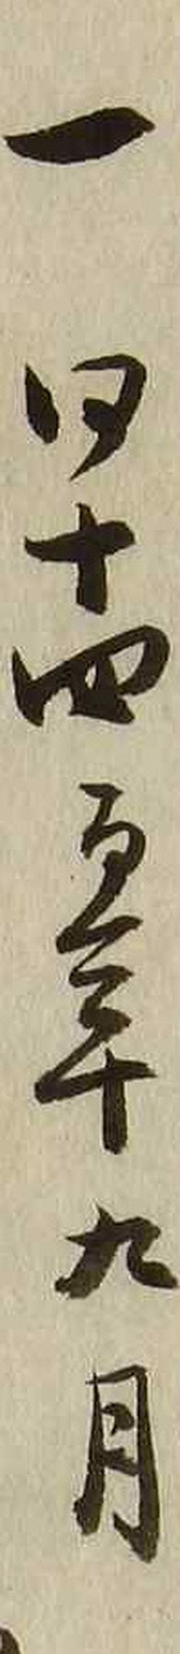一同十四酉年九月
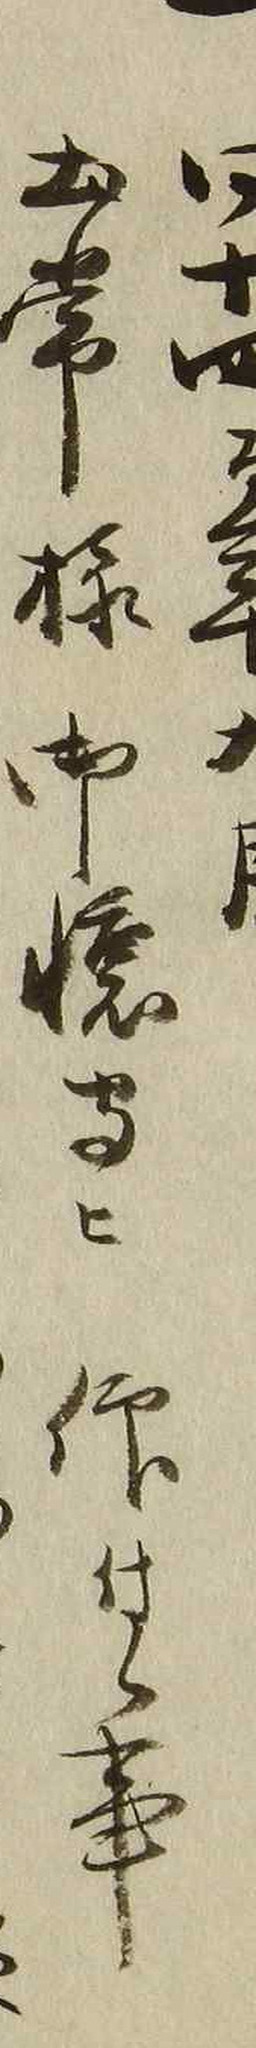土常様御懐守被仰付候事
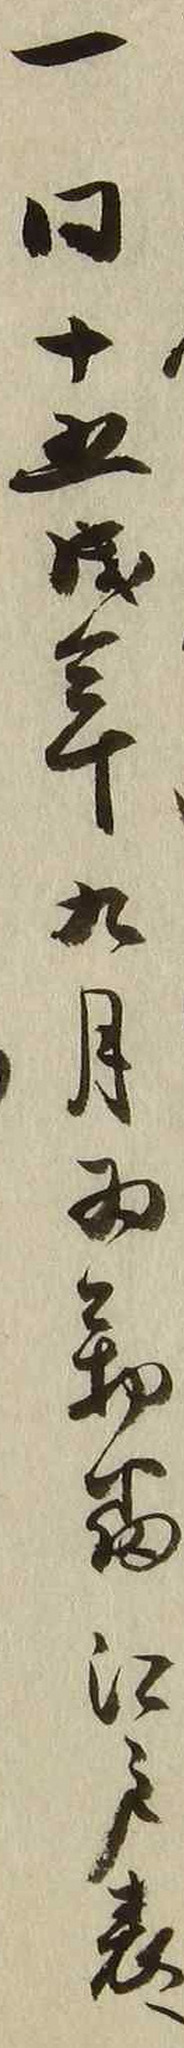一同十五戌年九月為勤番江戸表へ
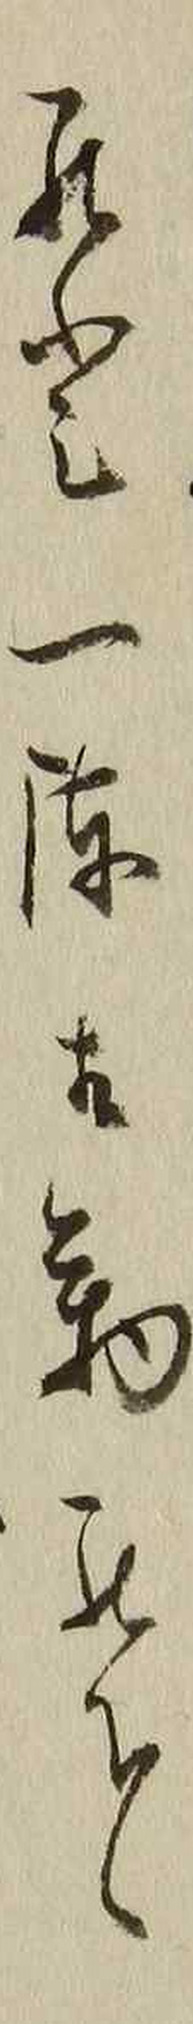罷登一陣相勤罷下候
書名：諸士系譜　巻之288　さ之部20
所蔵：会津若松市立会津図書館
